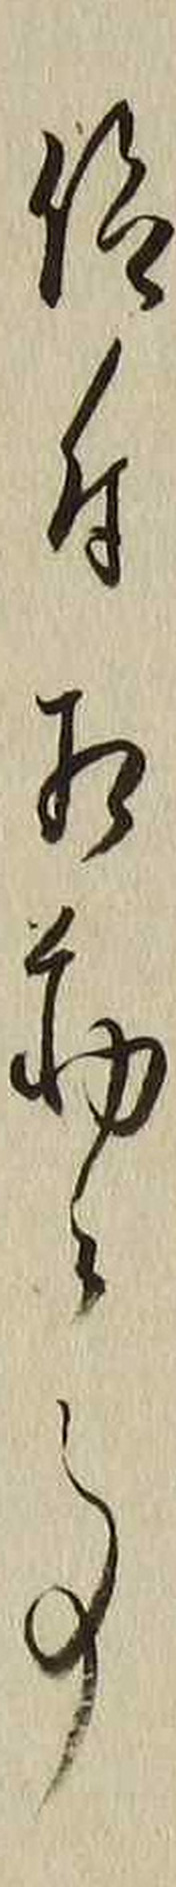仰付相勤候事
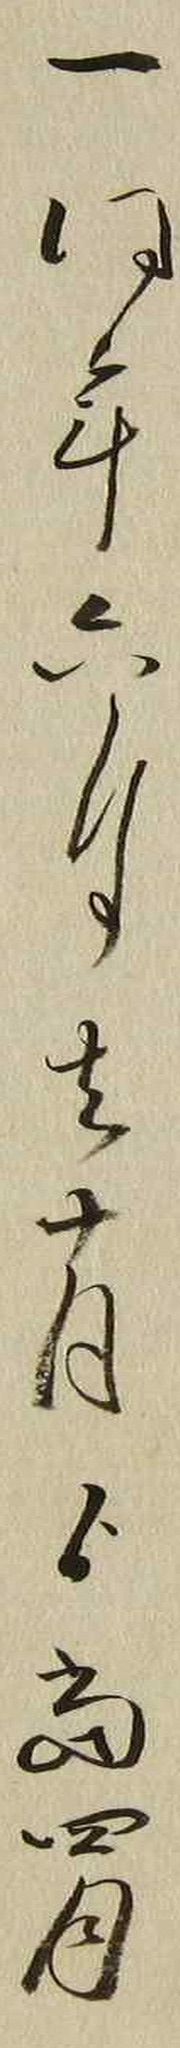一同年六月去十月ゟ当四月
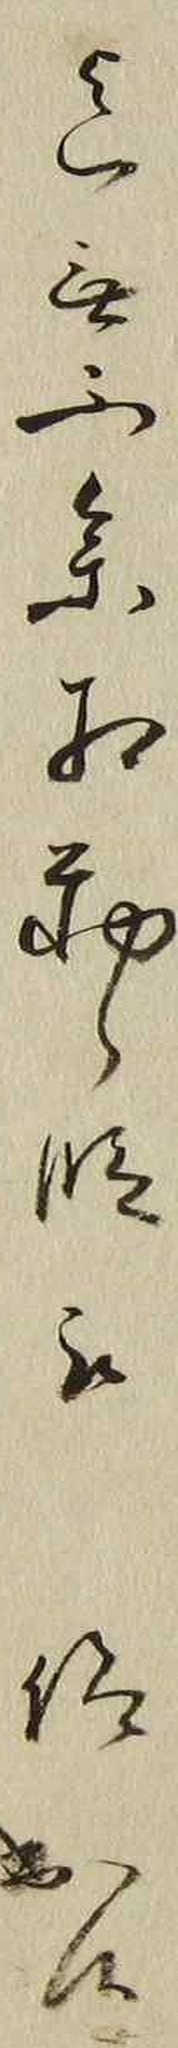迄無不参相勤候段被仰出候
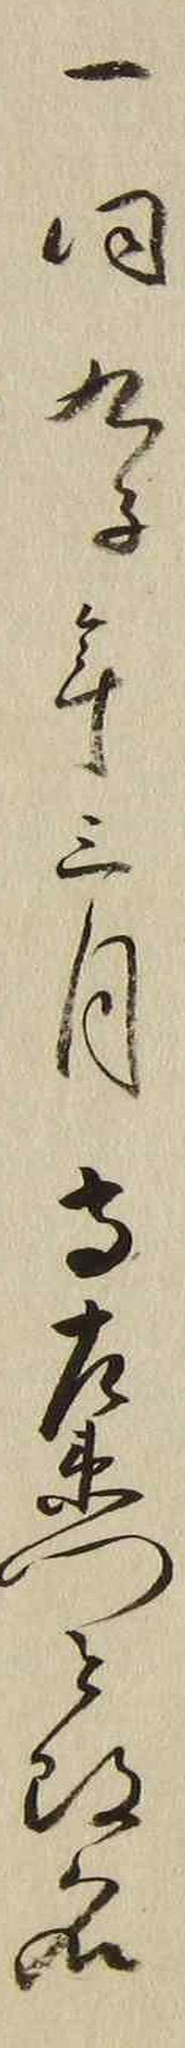一同九子年三月守左衛門と改名
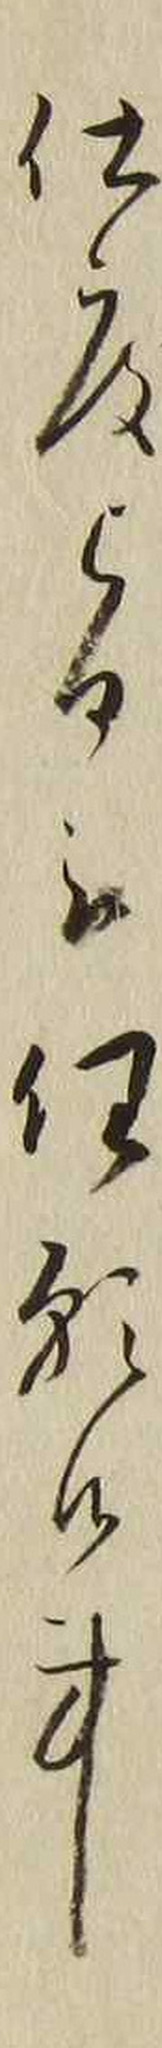仕度旨被任願候事
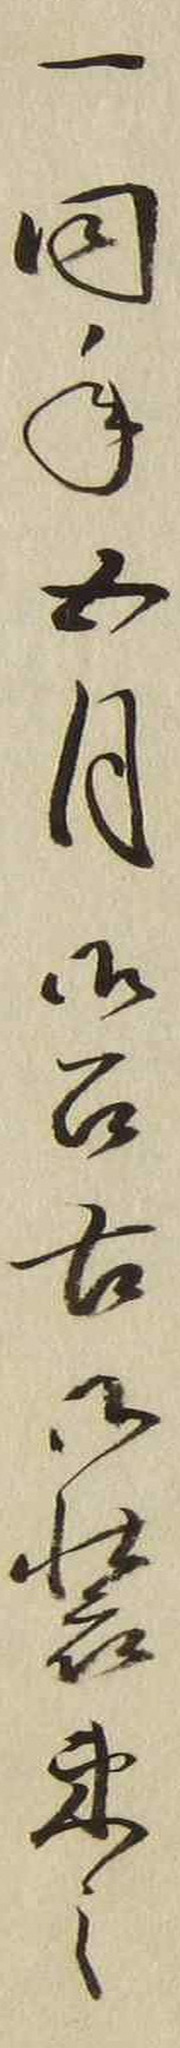一同年五月御召古御装束之

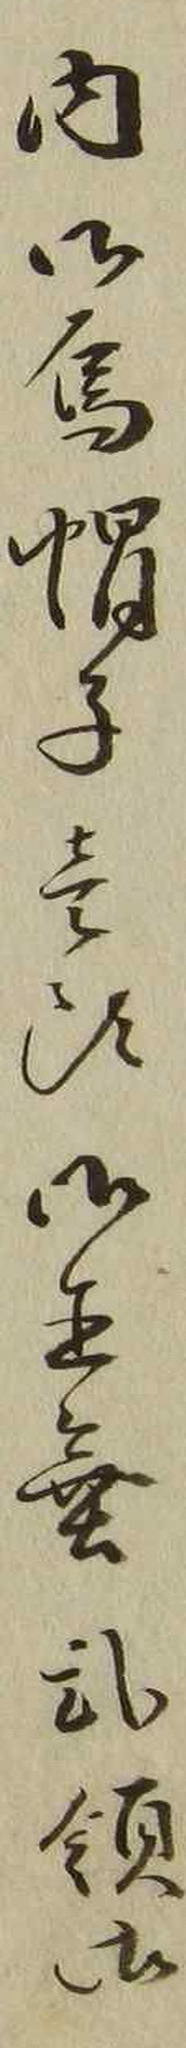内御烏帽子壱頭御直垂弐領御
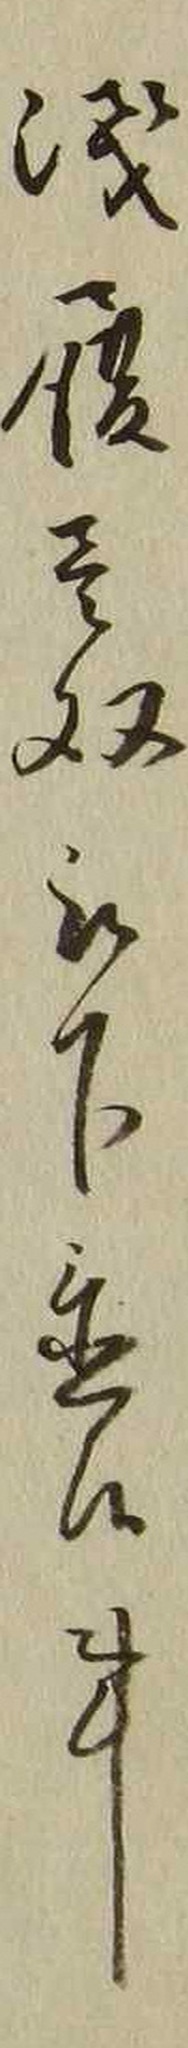浅履壱双被下置候事
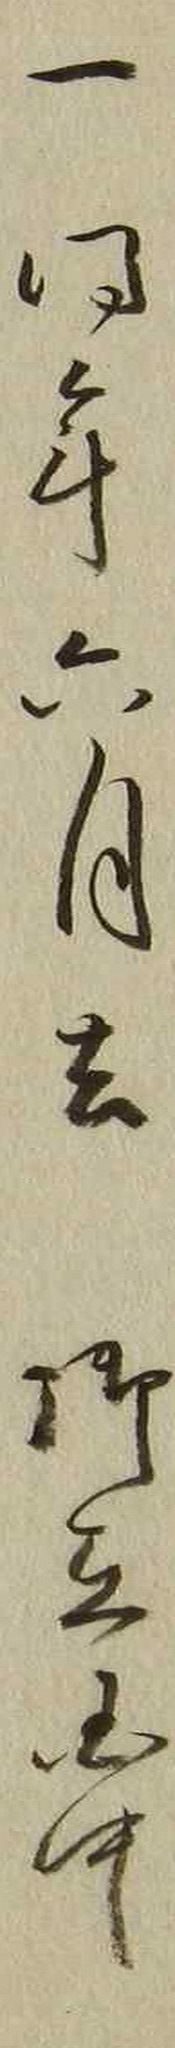一同年六月去御在国中
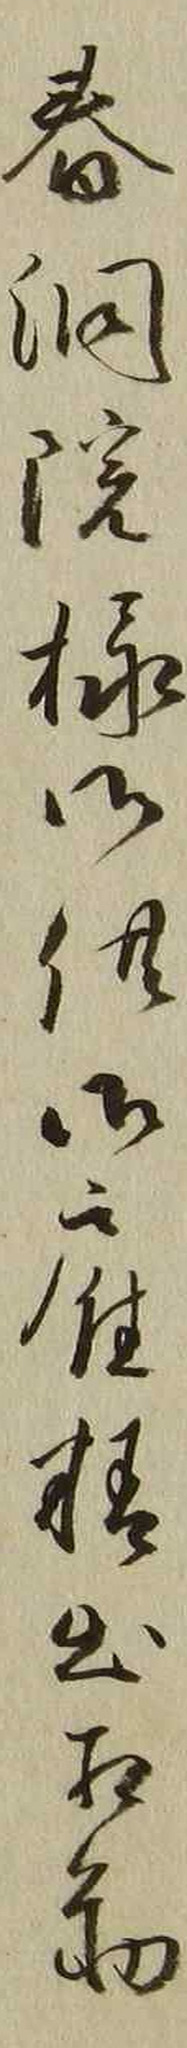春堂院様御供御雇精出相勤
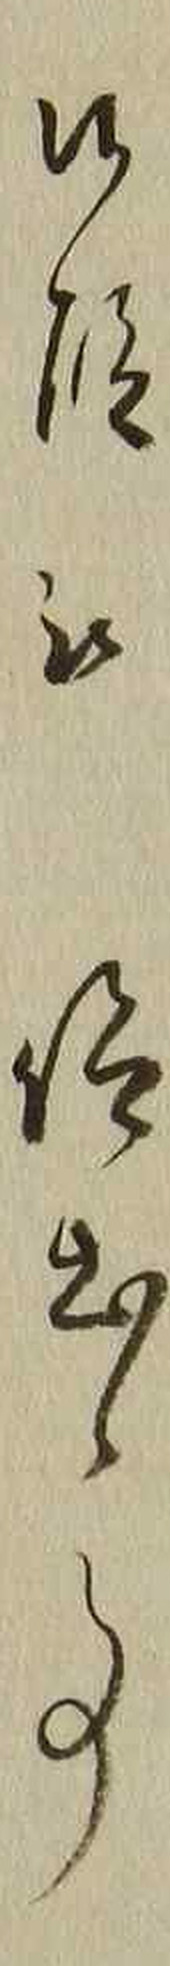候段被仰出候事
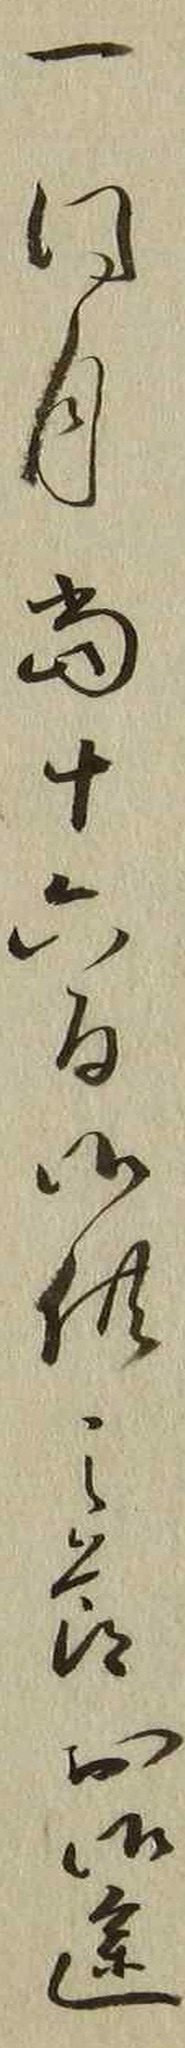一同月当十六日御供之節於御途
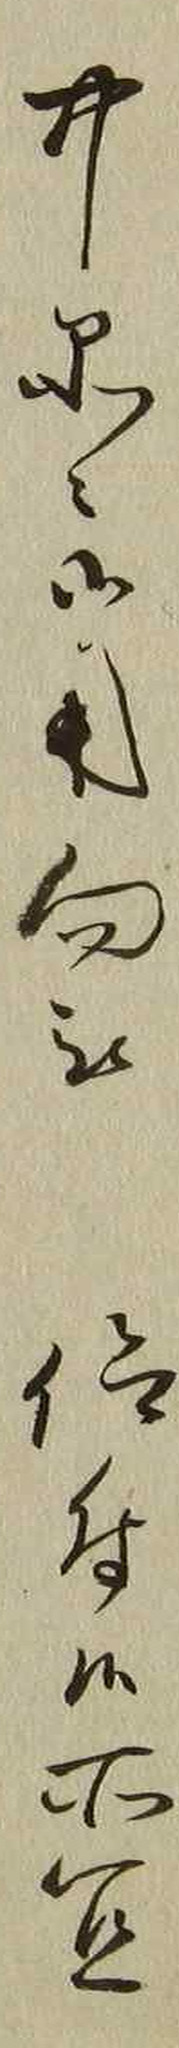中品々御用向被仰付候所宜
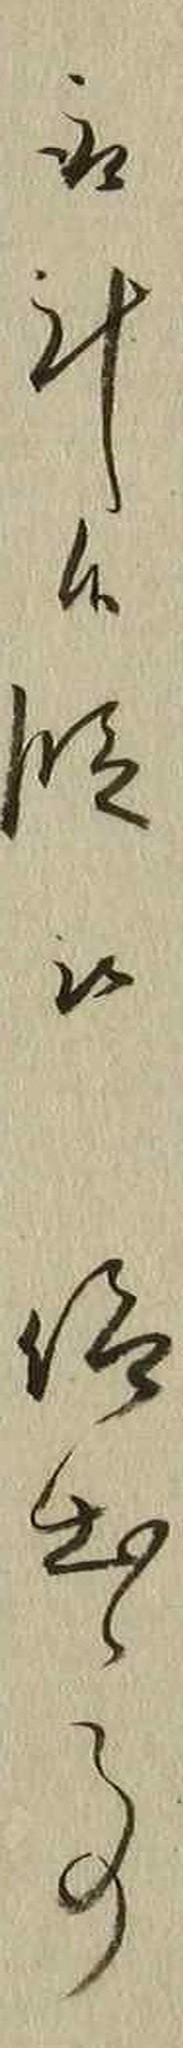取計候段被仰出候事
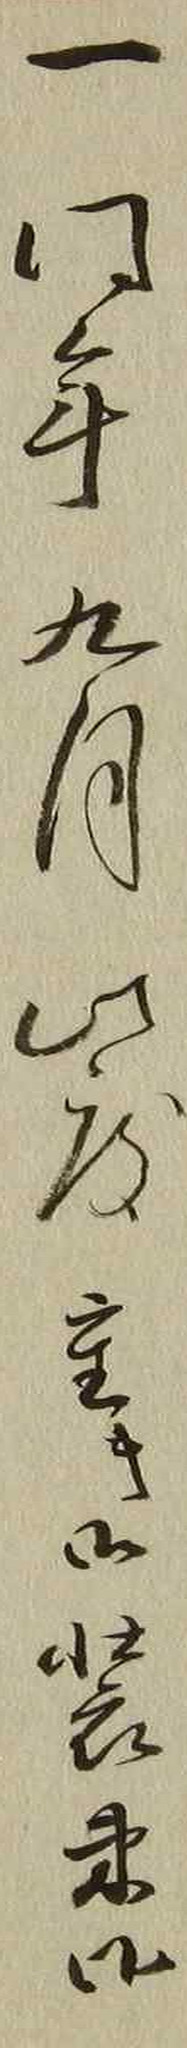一同年九月此度重キ御装束御
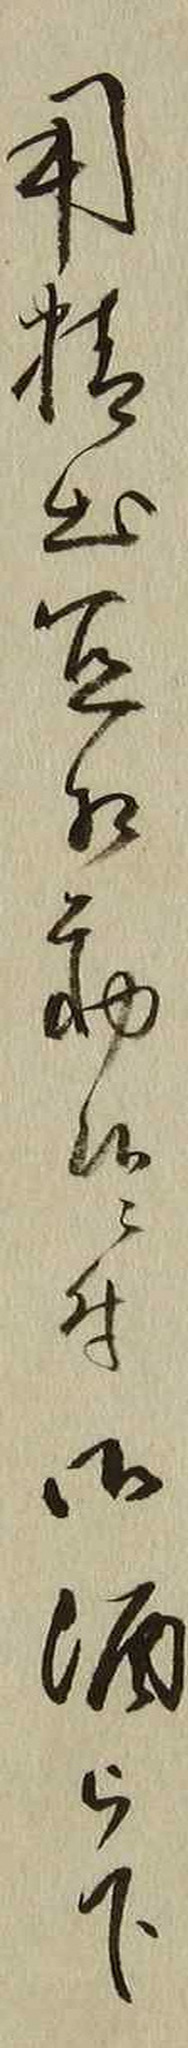用精出宜相勤候ニ付御酒被下
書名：諸士系譜　巻之70　を之部4
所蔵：会津若松市立会津図書館
